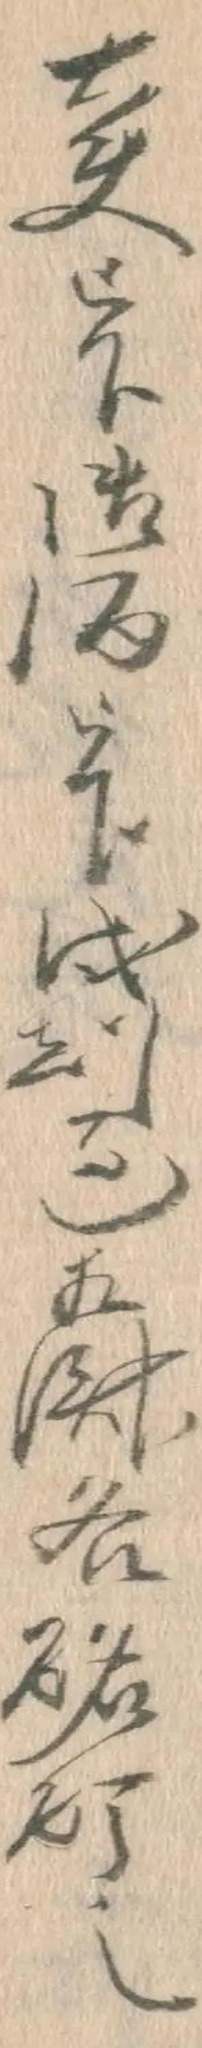大夫已下御酒被下戌刻過相済各酩酊也
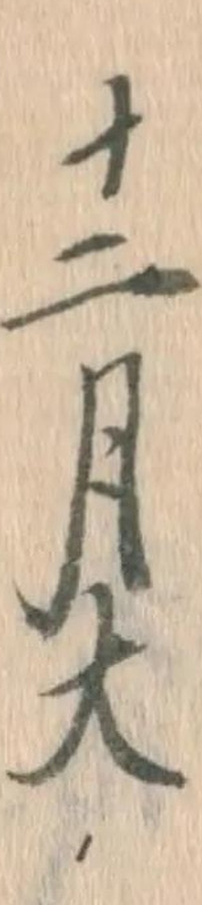十二月大
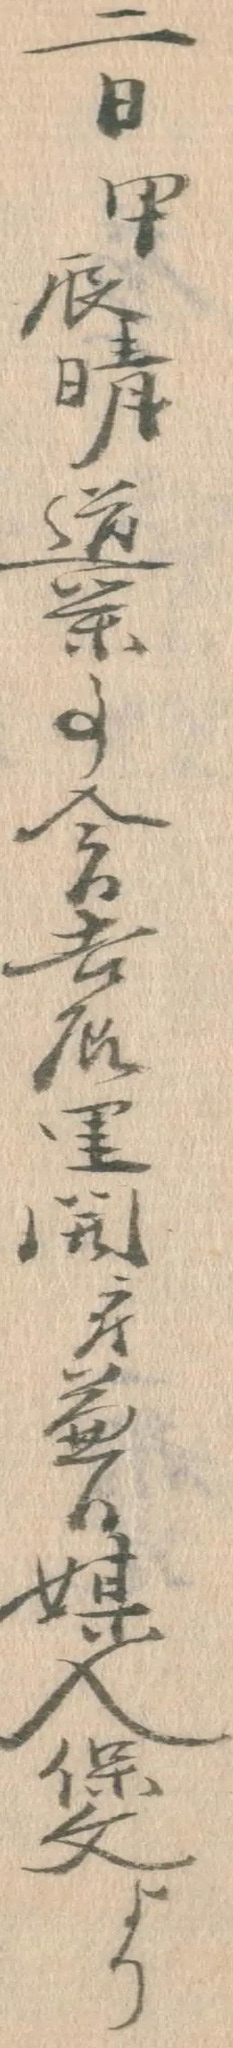二日甲辰晴道業事今日吉辰里開ニ付兼日媒人保文より
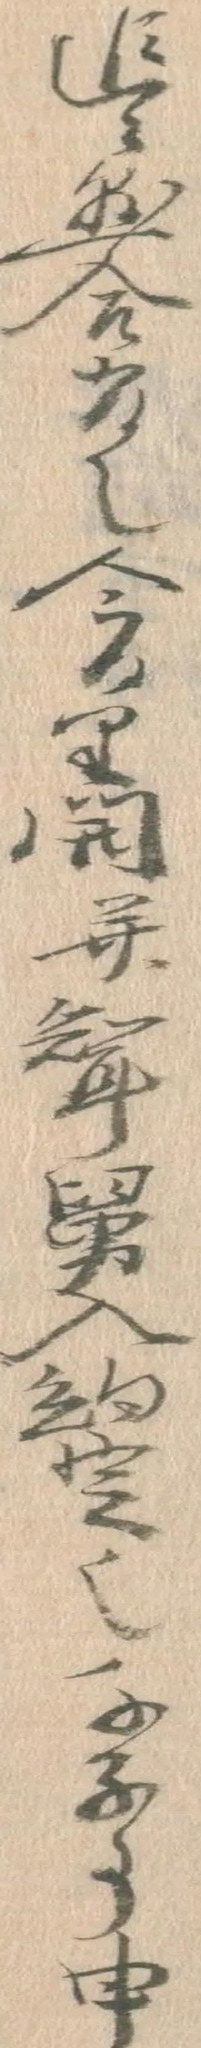追々懸合有之今日里開并聟舅入約定也ねね事申
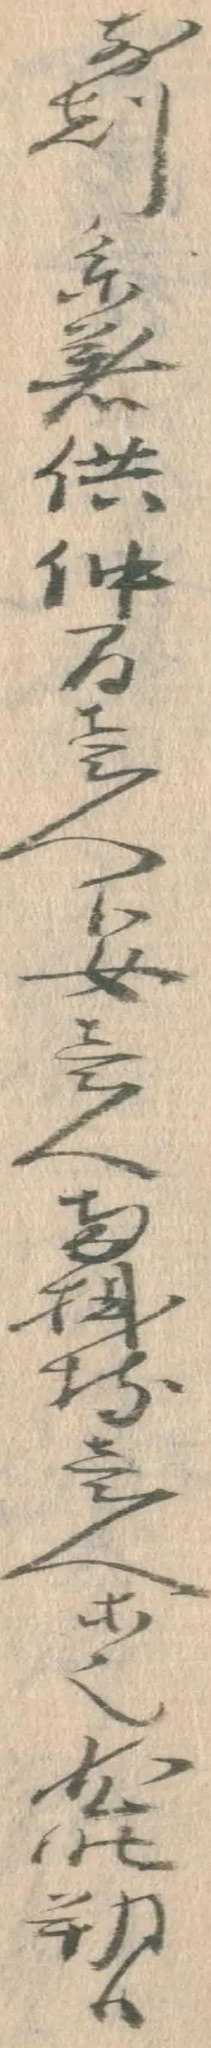前刻参着供仲間壱人下女壱人両掛持壱人等也尤時朔日
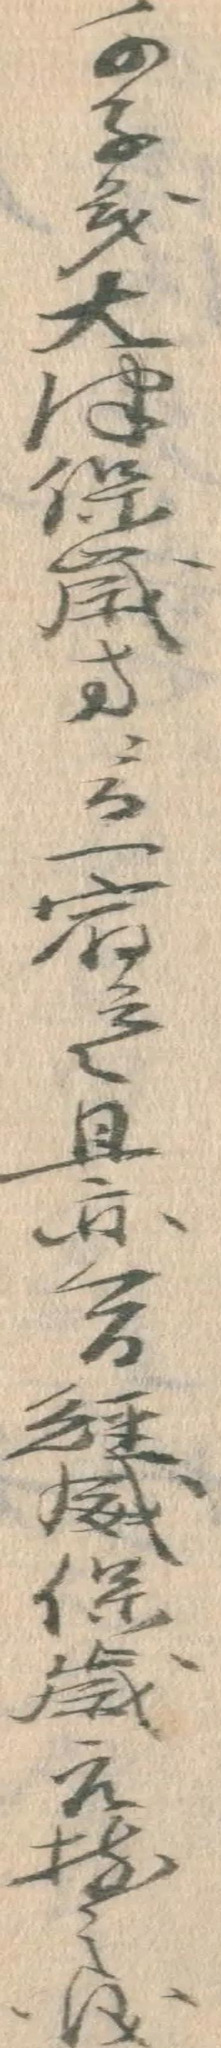ねね義大津保歳方ニ而一宿云々且亦今日経威保歳取持之儀
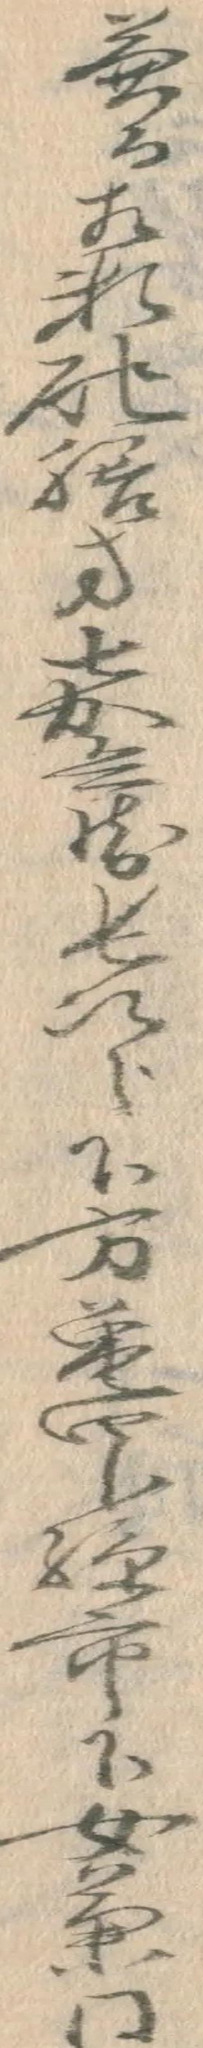兼而相頼配膳方嘉兵衛長次郎下方亀四郎孫市郎女兼同
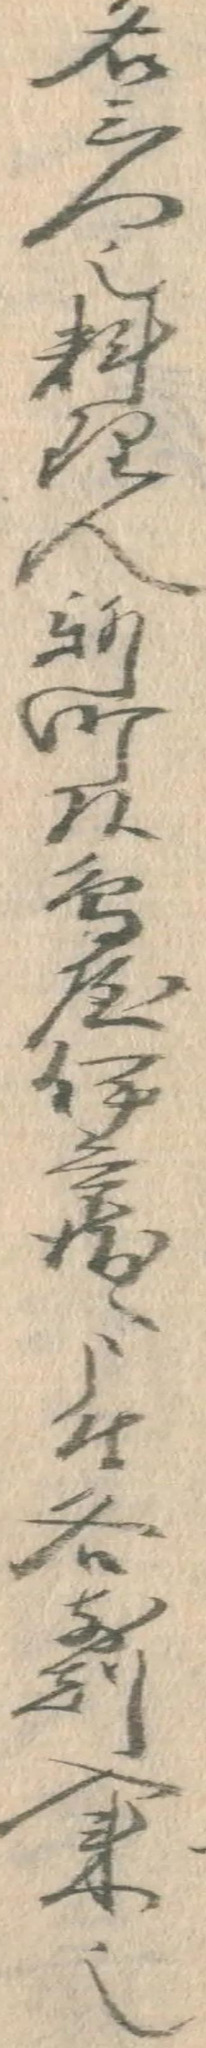名三人之料理人新町頭鳥屋伊兵衛へ申付各前刻入来也
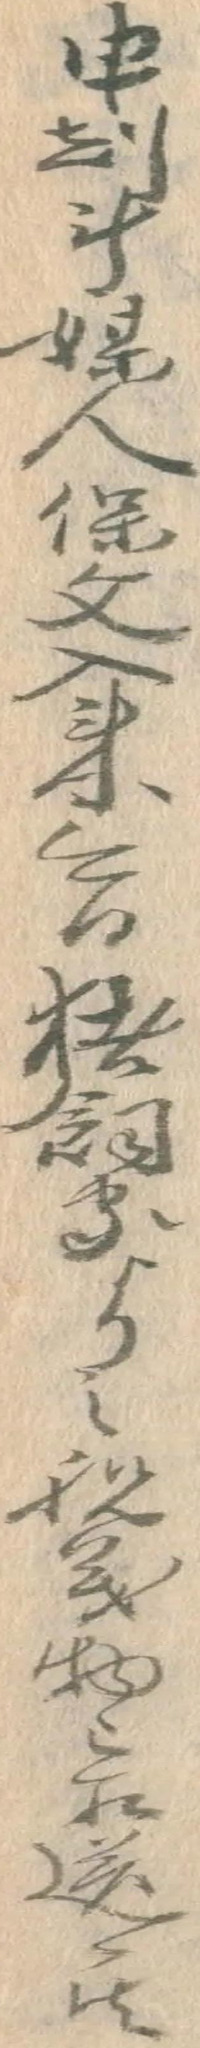申刻斗媒人保文入来今日猪飼家より之祝義物被相送候段

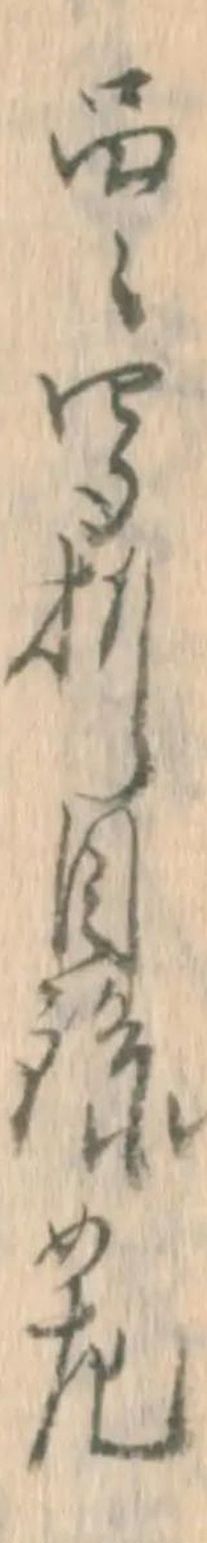品々四ツ折目録如左
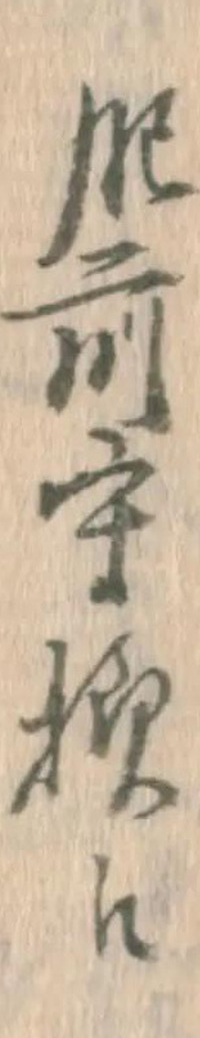筑前守様え
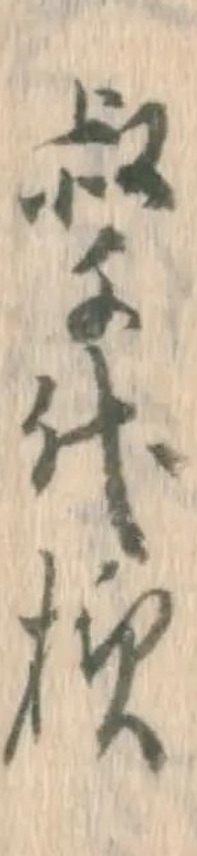叔千代様
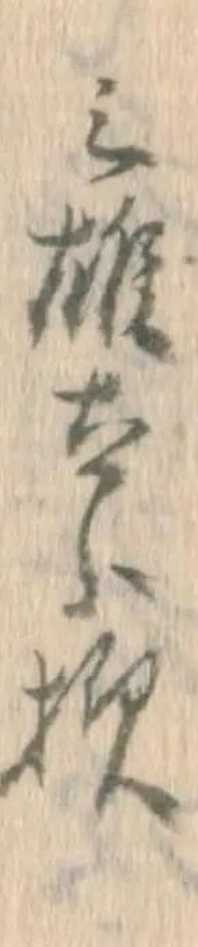三雄太郎様
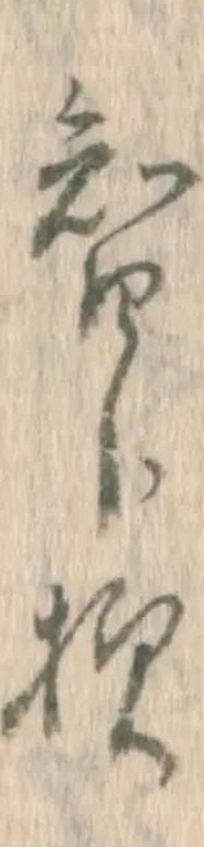知四郎様
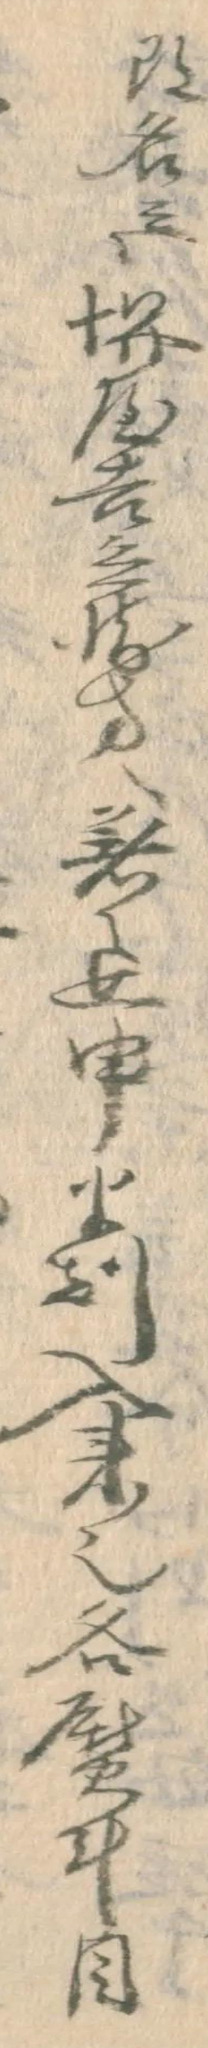改名云々堺屋吉兵衛方へ着之上申半刻入来也各熨斗目
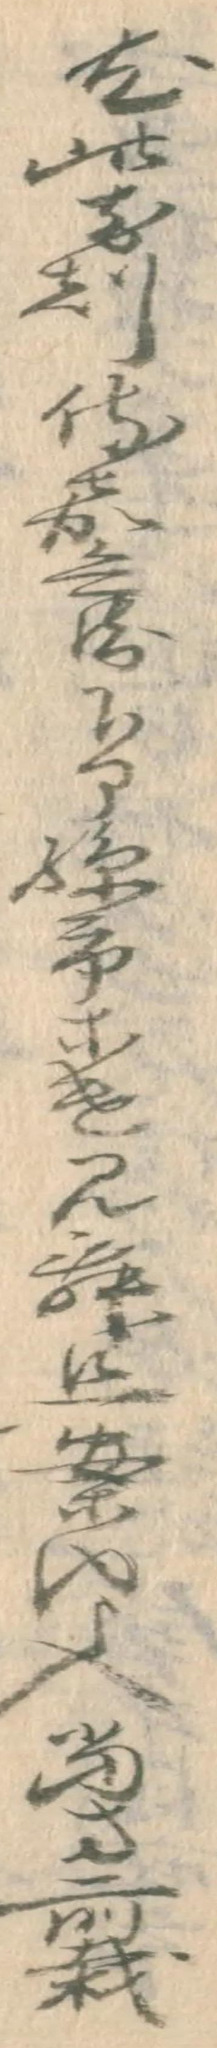尤此前刻侍嘉兵衛下部孫市等遣見舞且案内申入當方前栽
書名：賀茂社記録. 第66冊
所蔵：国立国会図書館 National Diet Library, JAPAN
